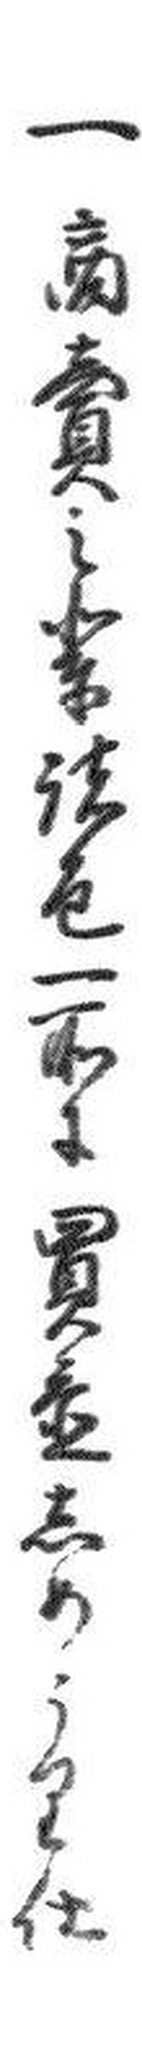一商売之輩諸色一所に買置しめうり仕
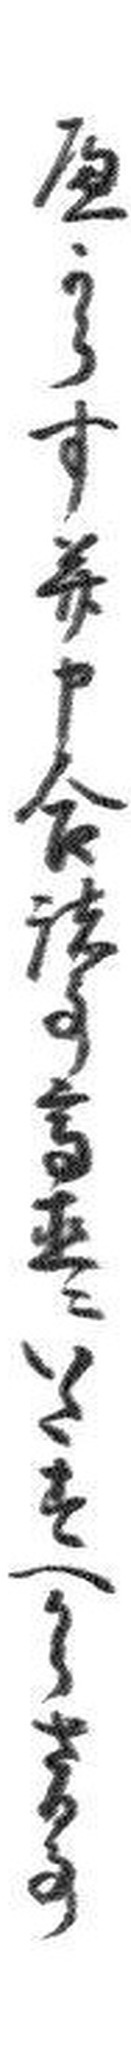へからす并申合諸事高直ニいたすへからさる事
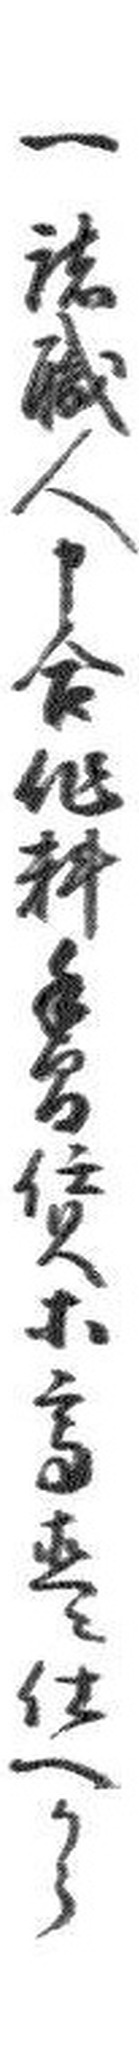一諸職人申合作料手間賃等高直ニ仕へから
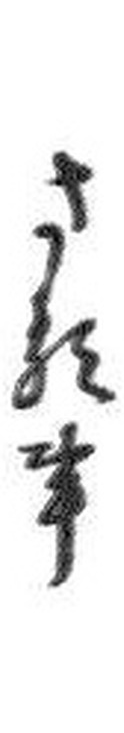さる事

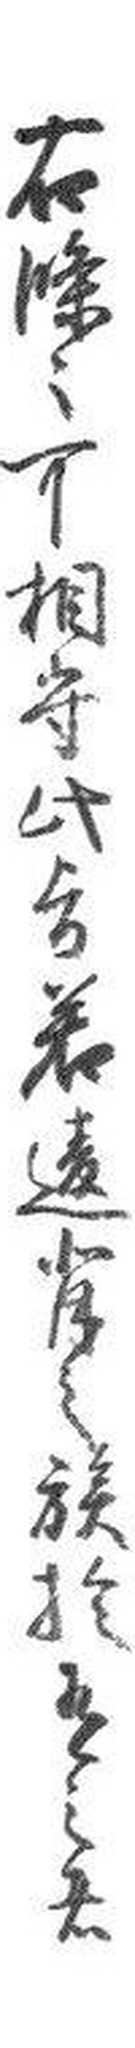右条々可相守此旨若違背之族於有之者
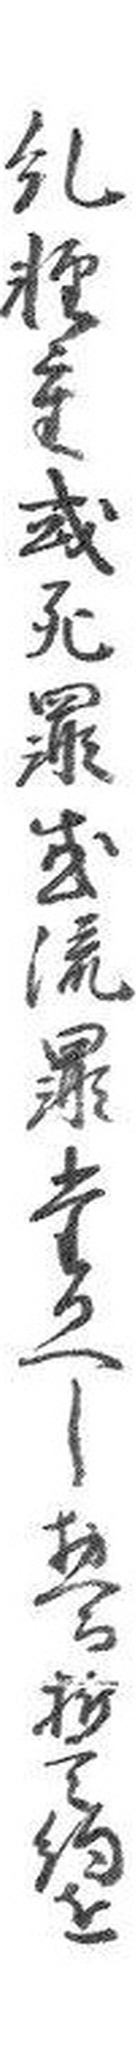糺軽重或死罪或流罪たるへし惣而誓約を
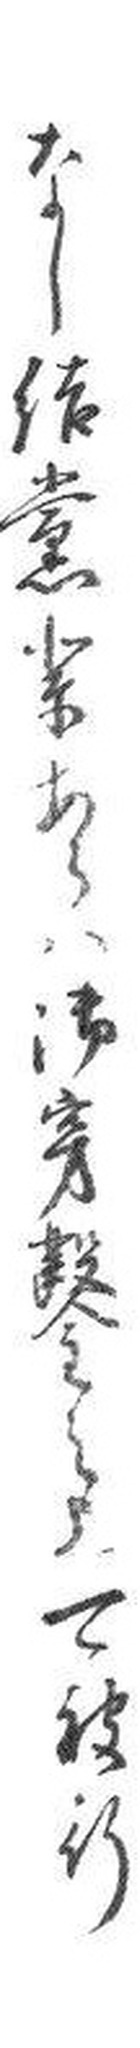なし結党輩あらは御穿鑿之上可被行
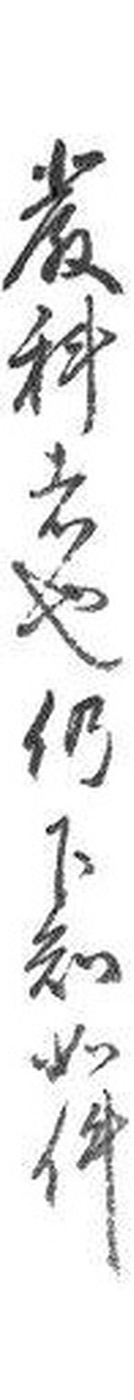厳科者也仍下知如件
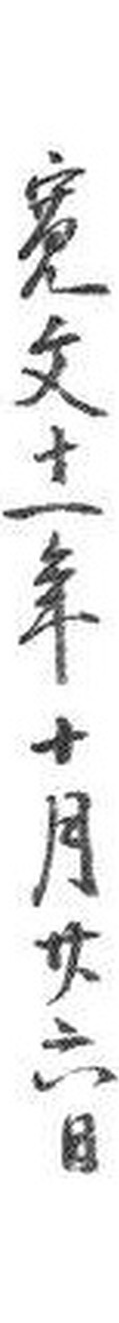寛文十一年十月廿六日
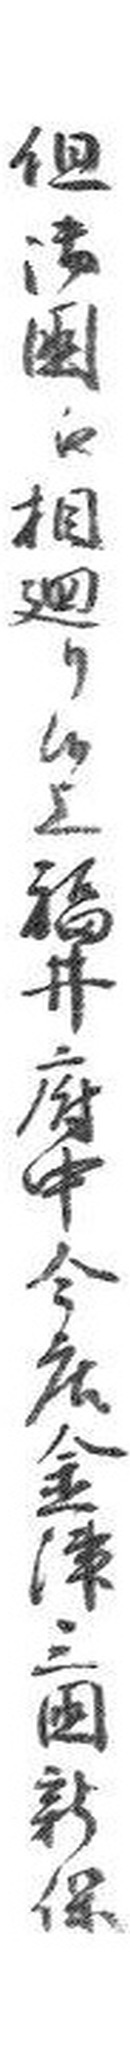但御国江相廻り候上福井府中今庄金津三国新保
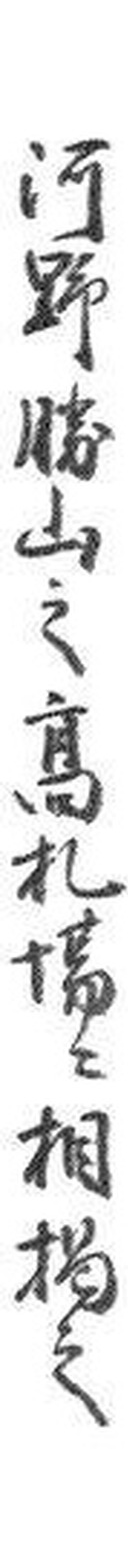河野勝山之高札場ニ相掲之
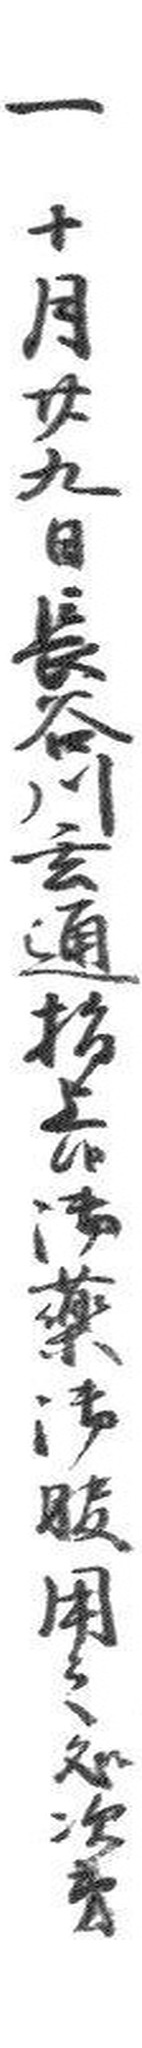一十月廿九日長谷川玄通指上候御薬御服用之処次第
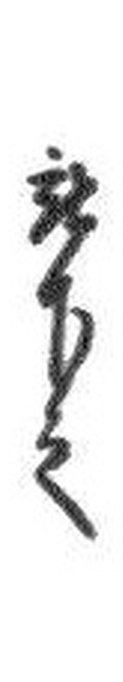被下之
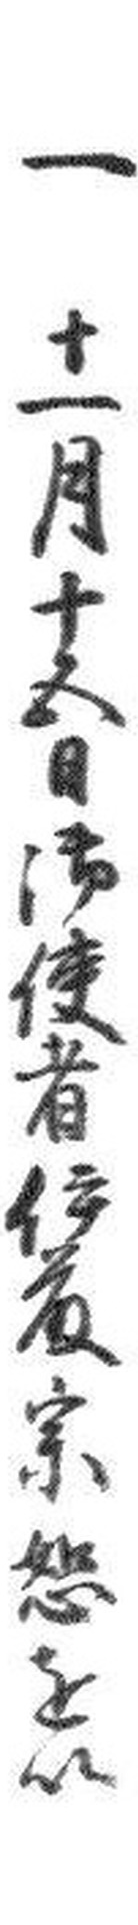一十一月十五日御使者伊藤宗恕を以
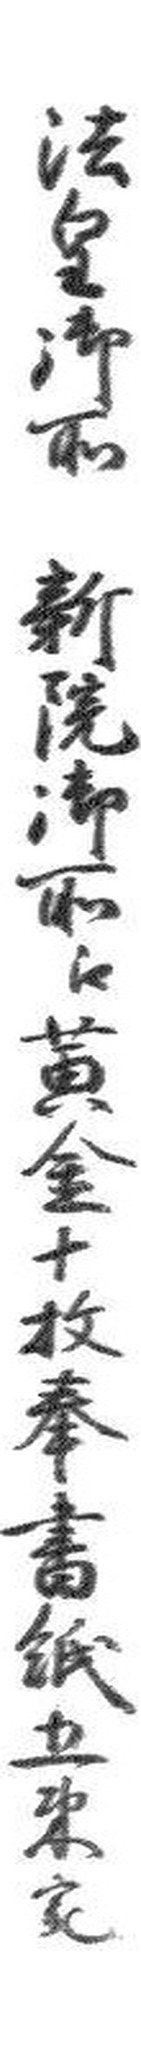法皇御所新院御所江黄金十枚奉書紙五束宛
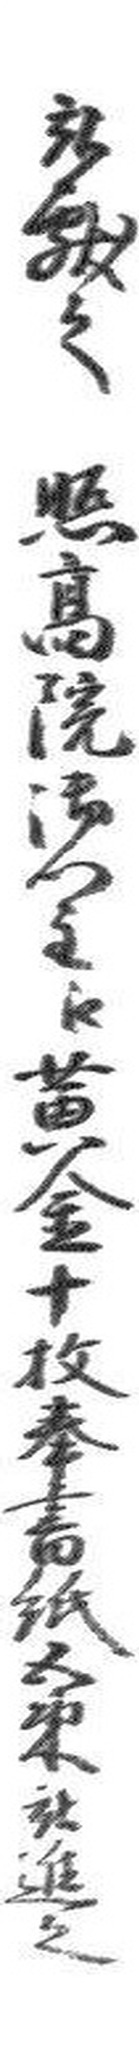被献之照高院御門主江黄金十枚奉書紙五束被進之
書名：家譜 八 光通公 従寛文十年到同十二年
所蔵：福井県文書館 Fukui Prefectural Archives
